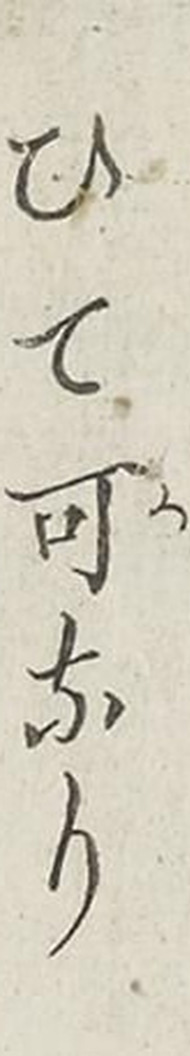ひて可なり
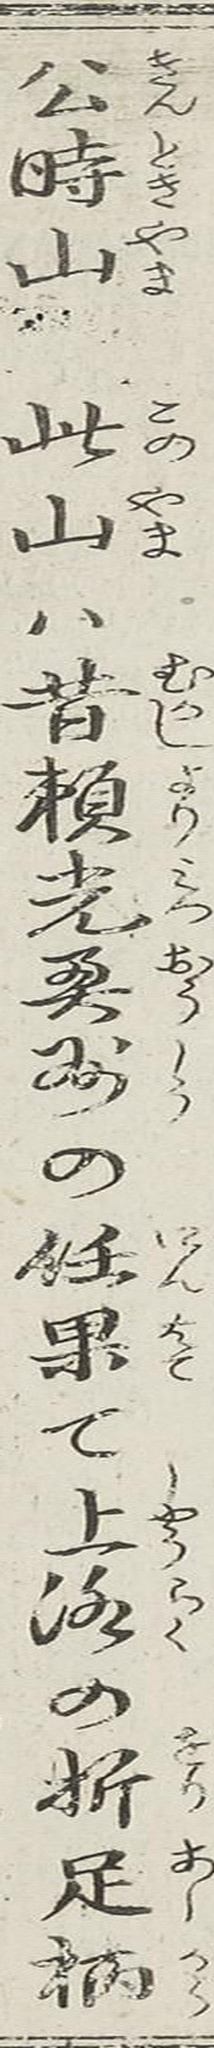公時山此山は昔頼光奥州の任果て上洛の折足柄
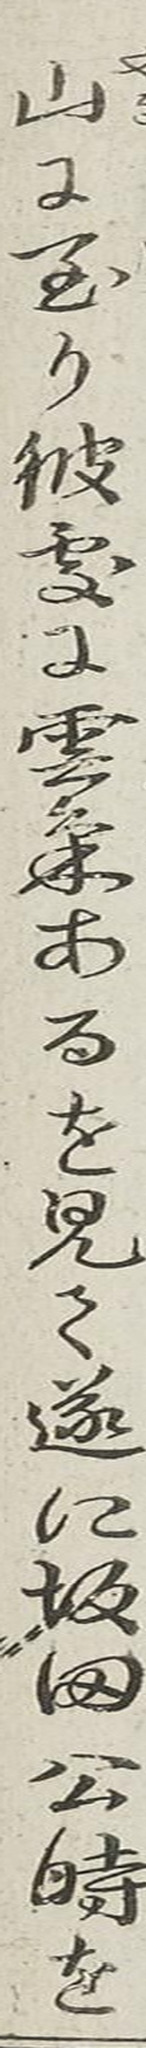山に至り彼處に雲氣あるを見て遂に坂田公時を
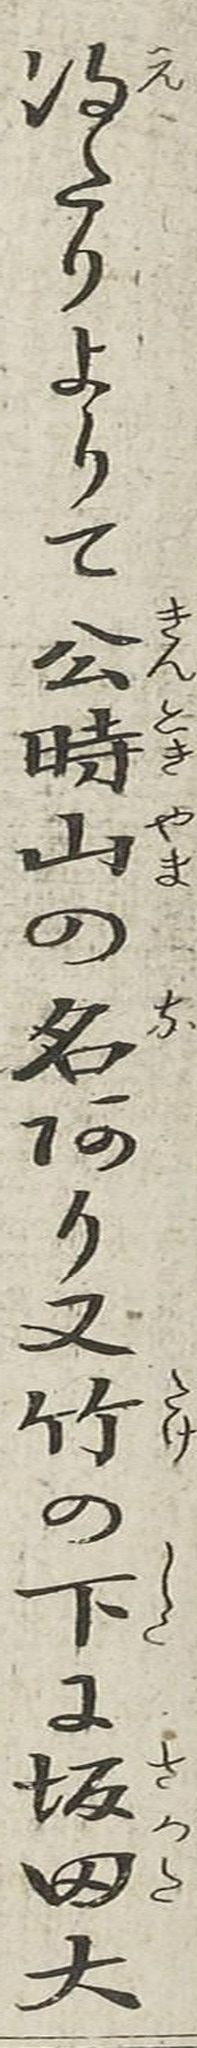得たりよりて公時山の名あり又竹の下に坂田大
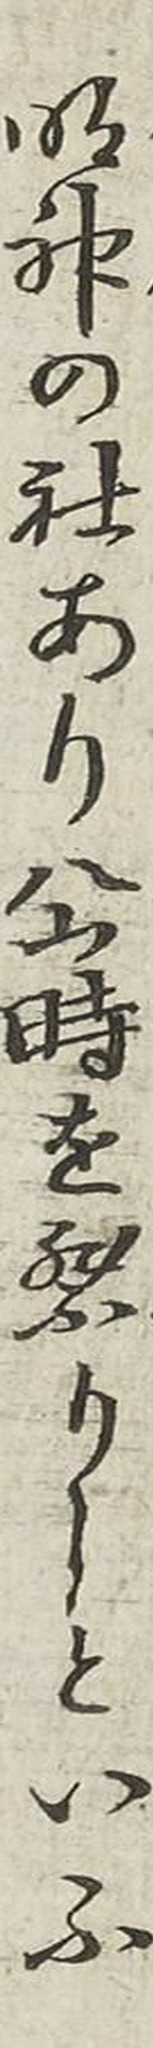明神の社あり公時を祭りしといふ
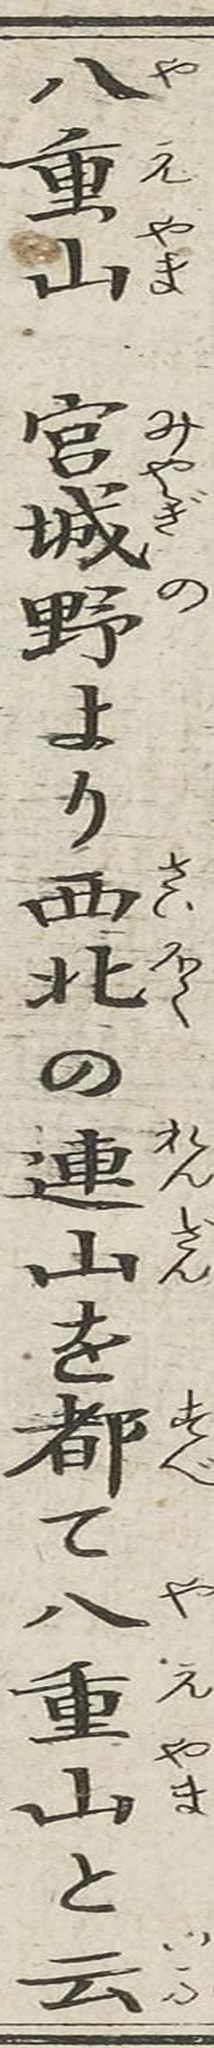八重山宮城野より西北の連山を都て八重山と云
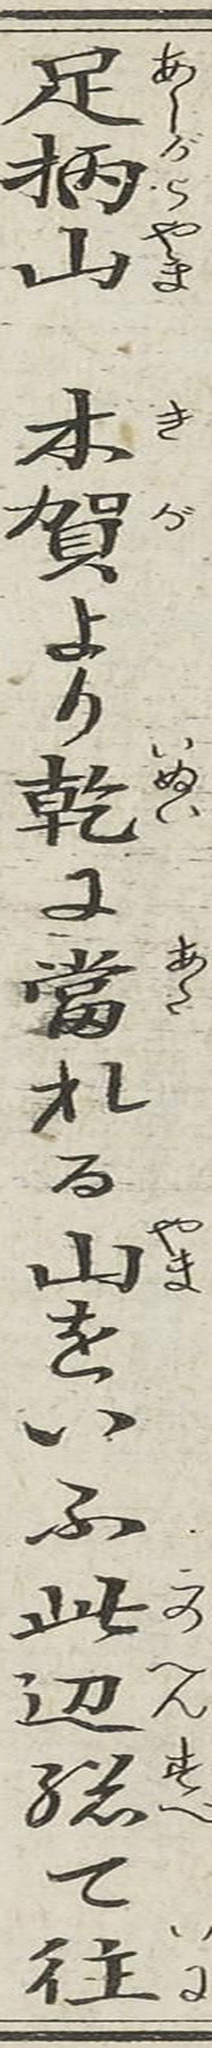足柄山木賀より乾に當れる山をいふ此辺総て往
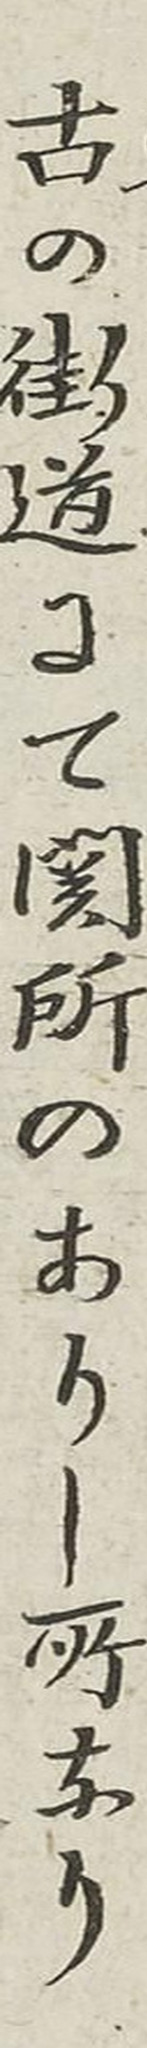古の街道にて関所のありし所なり
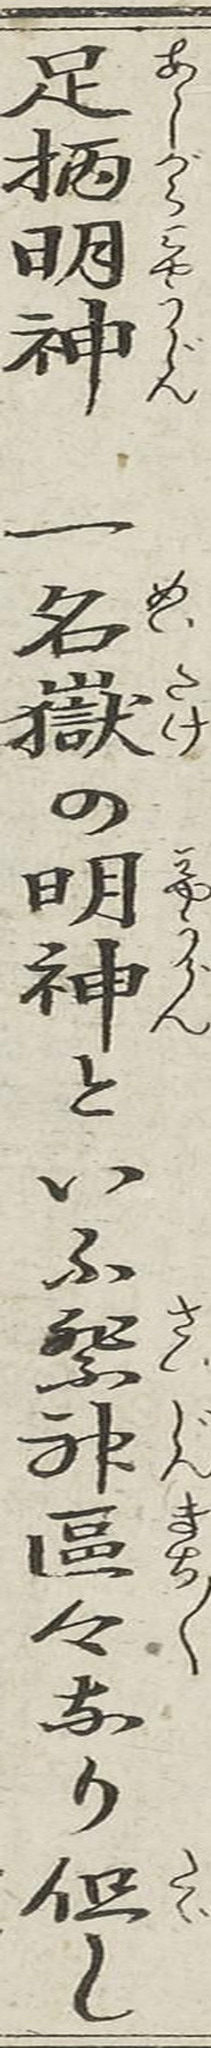足柄明神一名嶽の明神といふ祭神区々なり但し
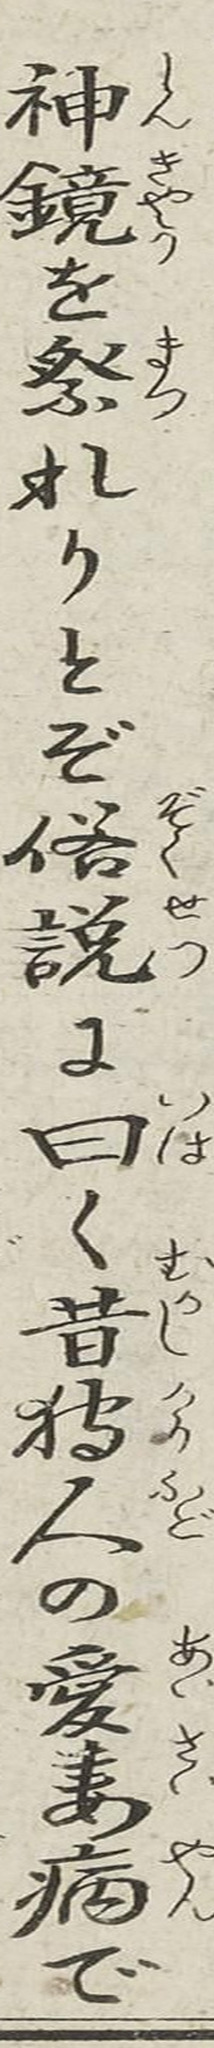神鏡を祭れりとぞ俗説に曰く昔彼人の愛妻病で
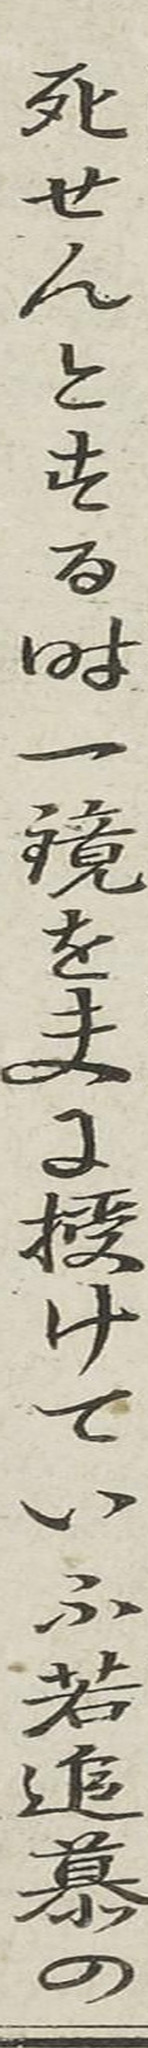死せんとする時一鏡を夫に授けていふ若追慕の
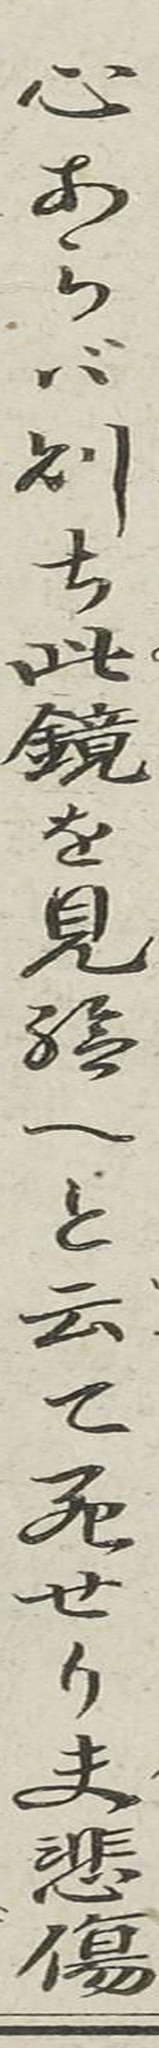心あらば則ち此鏡を見給へと云て死せり夫悲傷
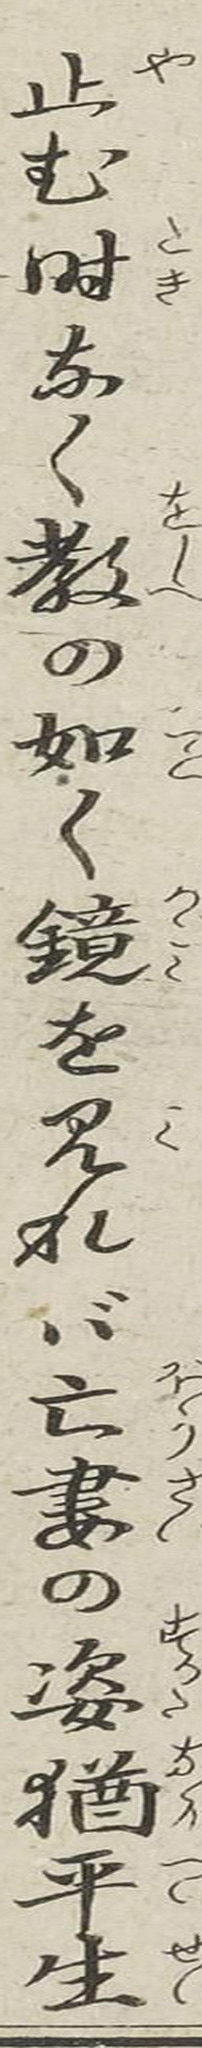止む時なく教の如く鏡を見れば亡妻の姿猶平生

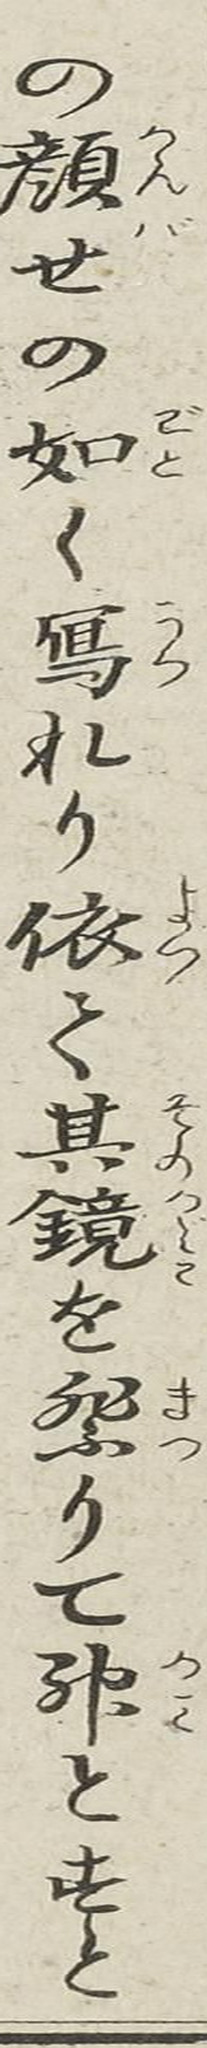の顔せの如く写れり依て其鏡を祭りて神とすと
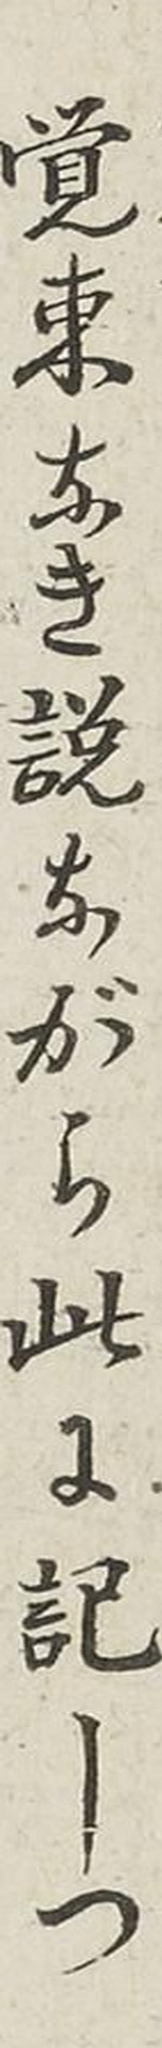覚束なき説ながら此に記しつ
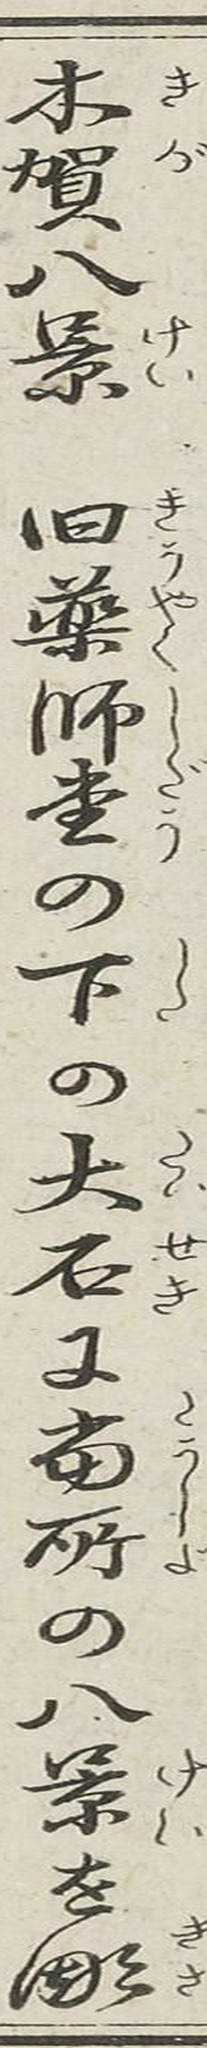木賀八景旧薬師堂の下の大石に当所の八景を彫
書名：箱根温泉誌　全
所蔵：東京大学地震研究所図書室 Earthquake Research Institute Library, The University of Tokyo, JAPAN
